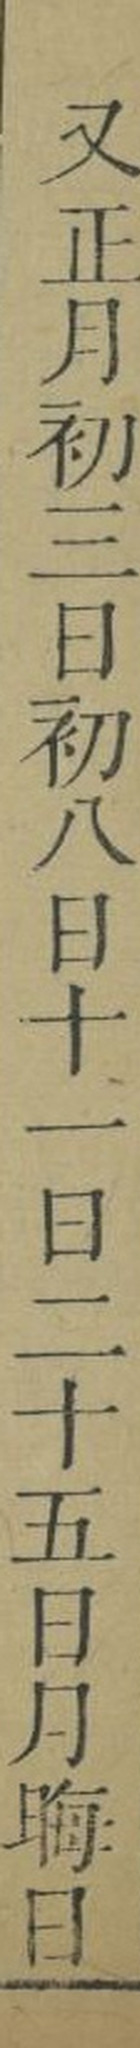又正月初三日初八日十一日二十五日月晦日
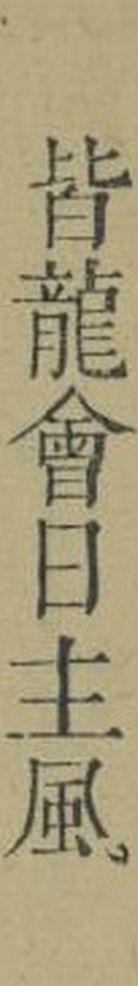皆龍會日主風
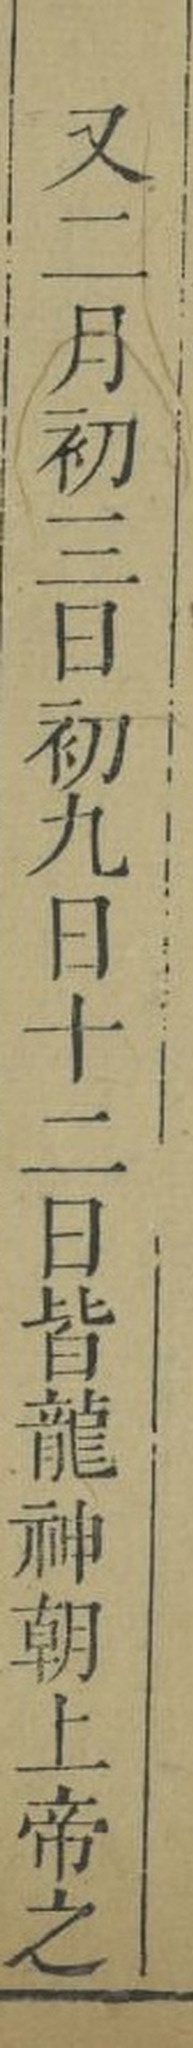又二月初三日初九日十二日皆龍神朝上帝之

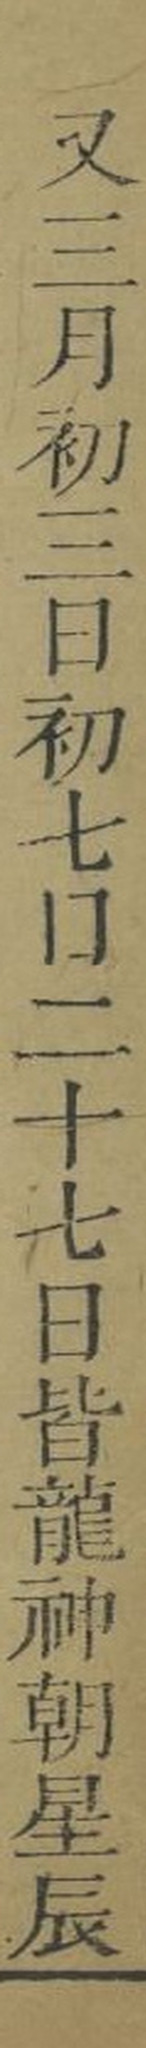又三月初三日初七日二十七日皆龍神朝星辰
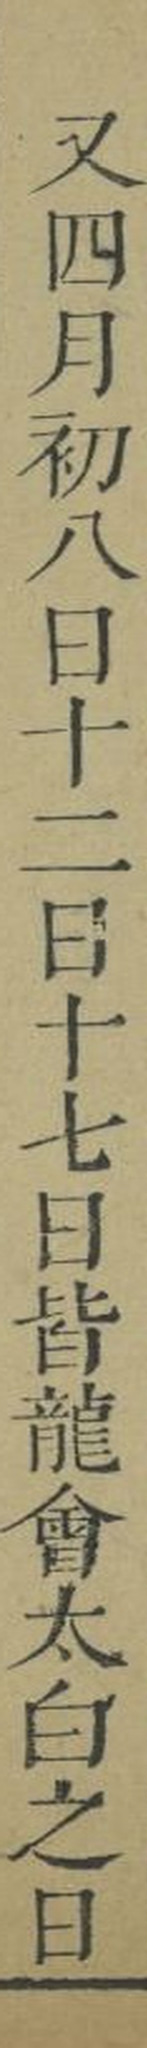又四月初八日十二日十七日皆龍會太白之日
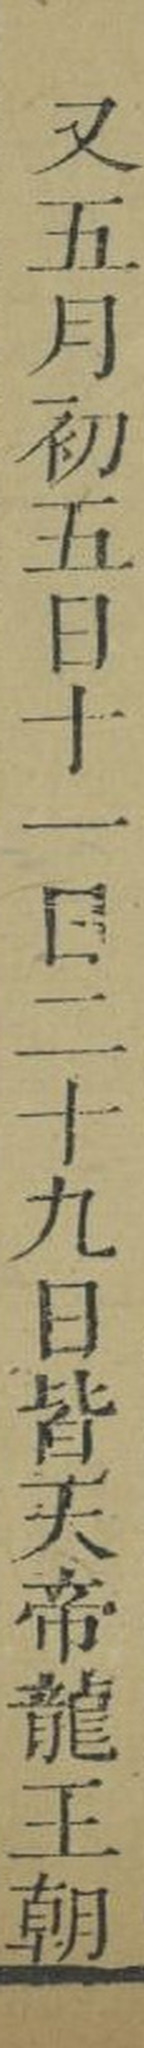又五月初五日十一日二十九日皆天帝龍王朝
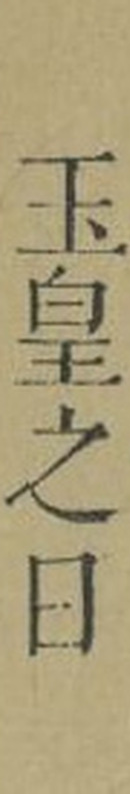玉皇之日
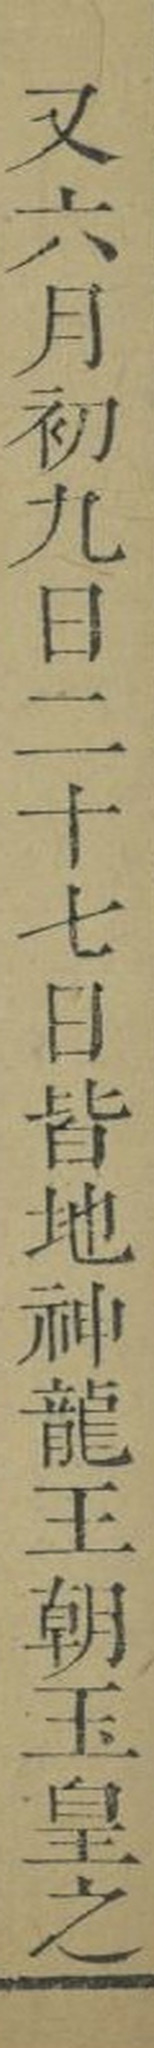又六月初九日二十七日皆地神龍王朝玉皇之
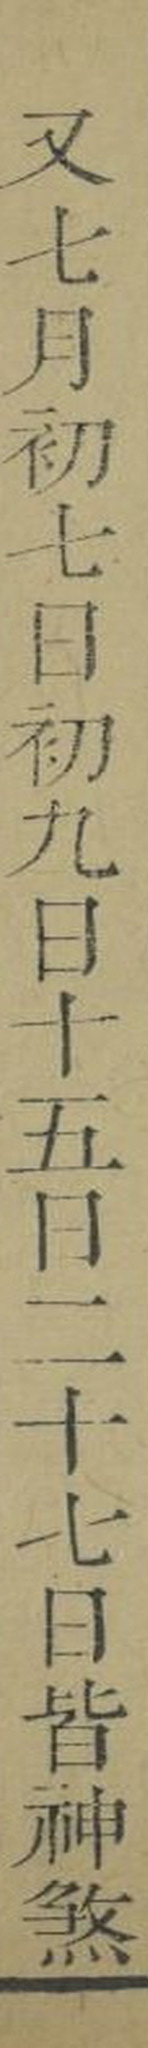又七月初七日初九日十五日二十七日皆神煞
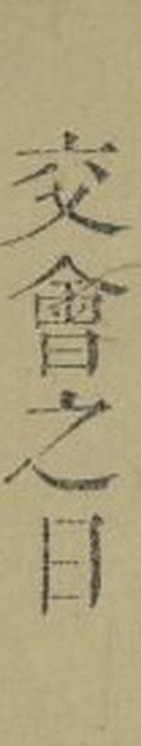交會之日
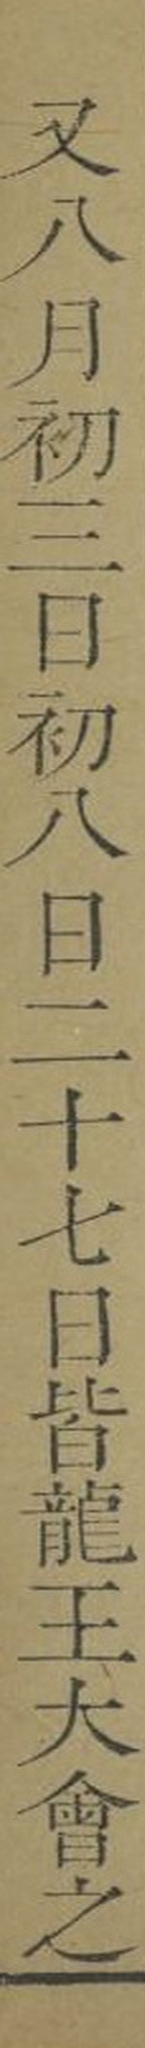又八月初三日初八日二十七日皆龍王大會之

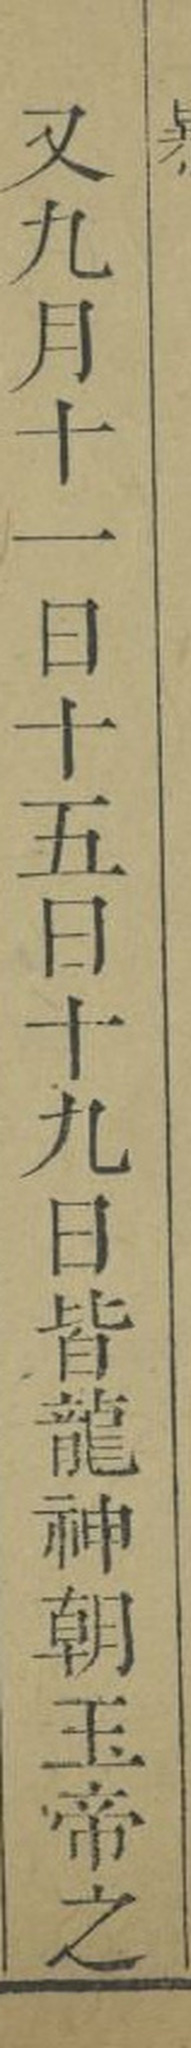又九月十一日十五日十九日皆龍神朝玉帝之
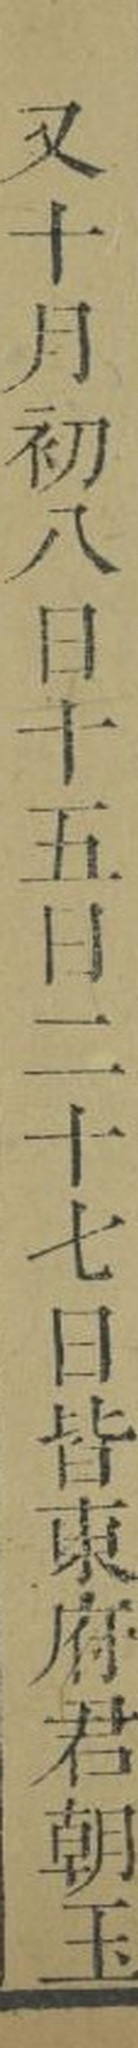又十月初八日十五日二十七日皆東府君朝玉
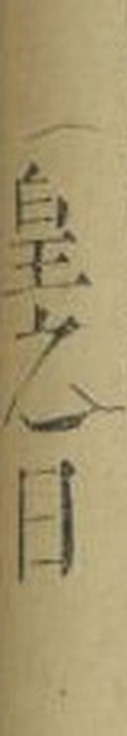皇之日
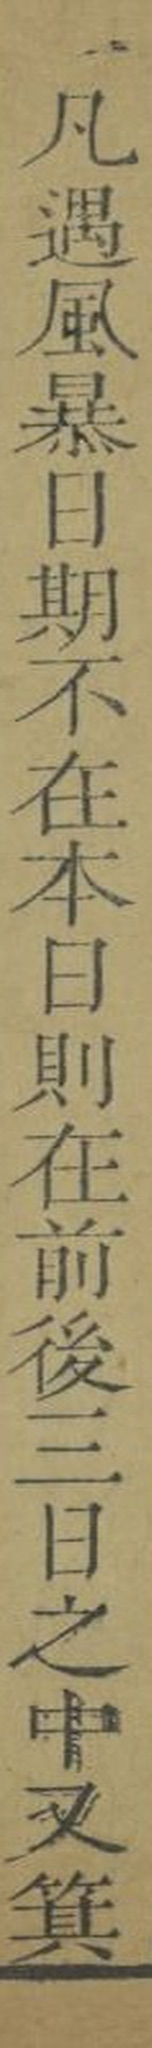凡遇風暴日期不在本日則在前後三日之中又箕
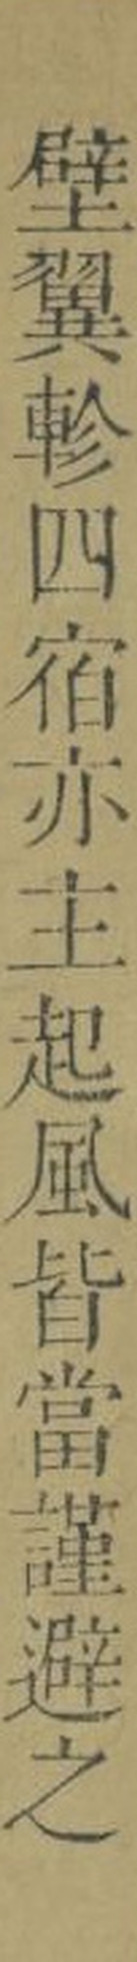壁翼軫四宿亦主起風皆當謹避之
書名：中山伝信録 巻一
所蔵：University of the Ryukyus Library
